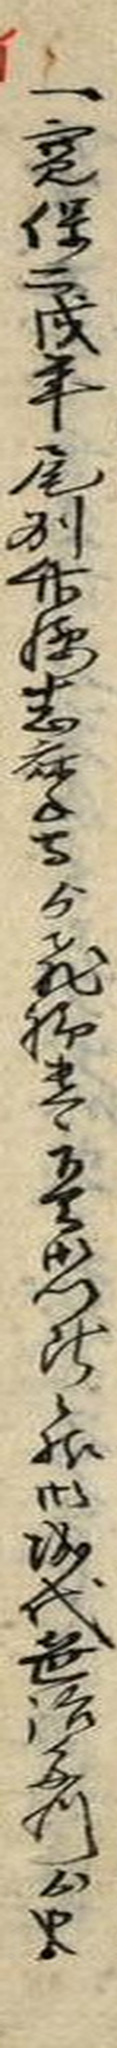一寛保二戌年尾州竹腰志摩守ゟ飛脚遣候下馬御門断候様御城代笹治多門ゟ

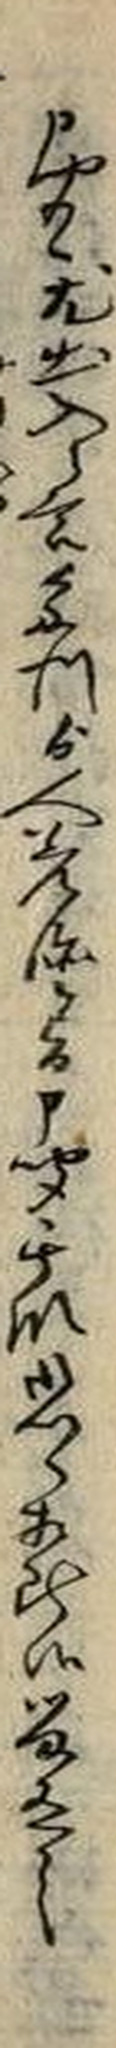申聞候尤出入之節多門ゟ人差添候旨申聞其段御門へ相断候留有之
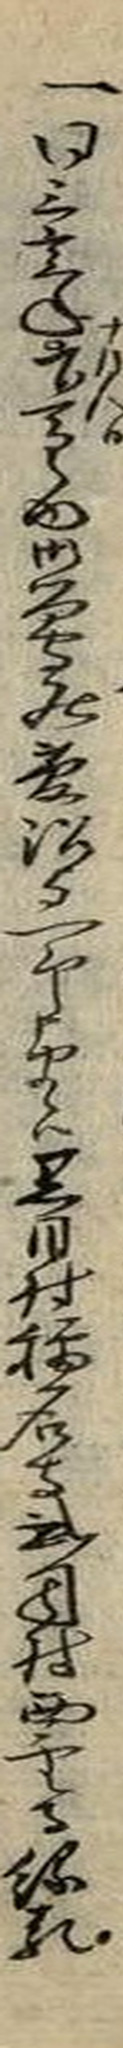一同三亥年十月八日下馬之内御留守居菅沼与市郎申聞候ハ黒目村称名寺武周村西雲寺縁類
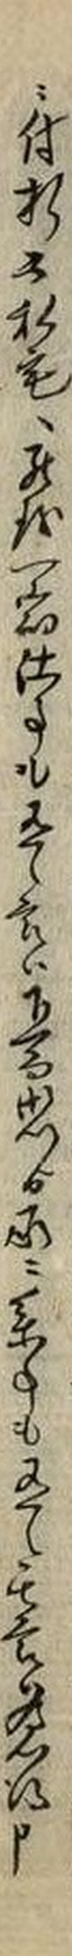ニ付折々私宅へ罷越一宿仕事も有之節ハ下馬御門ゟ承ニ参事も有之其節為心得申
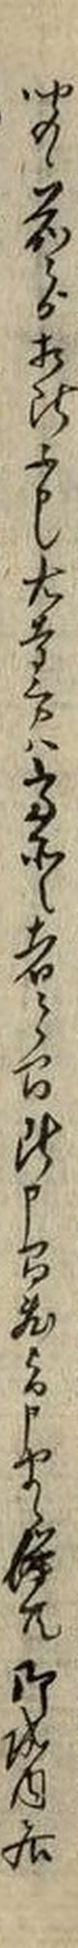聞候前々ゟ相断不申候右寺方ハ当所之者ニ候間断申間敷旨申聞候得共御城内居
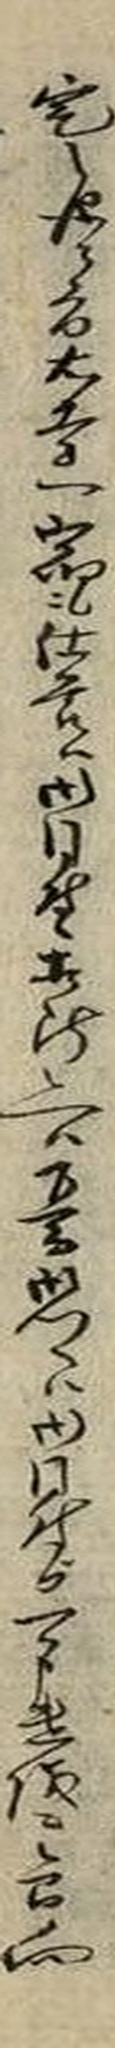宅之儀ニ候間右寺一宿も仕節ハ御目付へ相断候へハ下馬御門へハ御目付ゟ可申遣儀ニ候間向
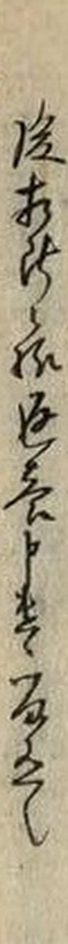後相断候様返答申遣候留有之
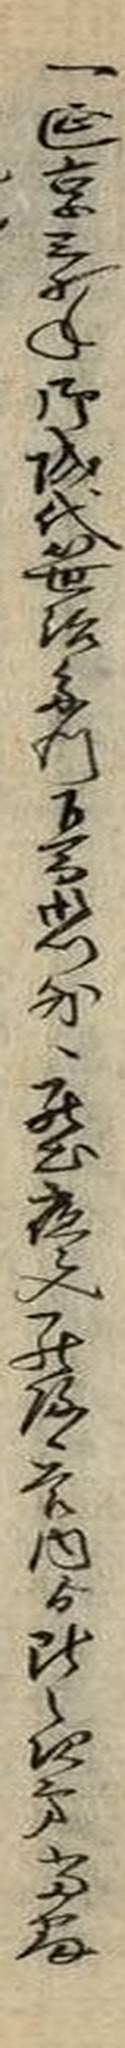一延享三寅年御城代笹治多門下馬御門外へ罷出夜ニ入罷帰候節内ゟ断之次第当番
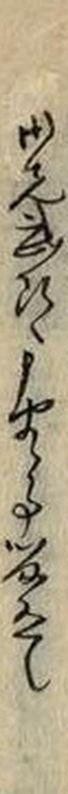御先武頭へ申聞候事留有之
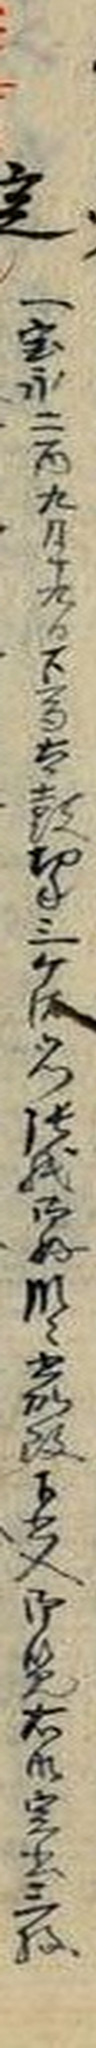一宝永二酉九月十九日下馬太鼓切手三ヶ所御門張紙御好段々書加改下書入御覧右御定書三枚
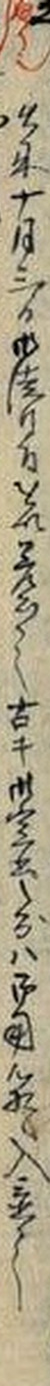出来十月三日御徒目付を以差出之古キ御定書之分ハ御用箱江入置之
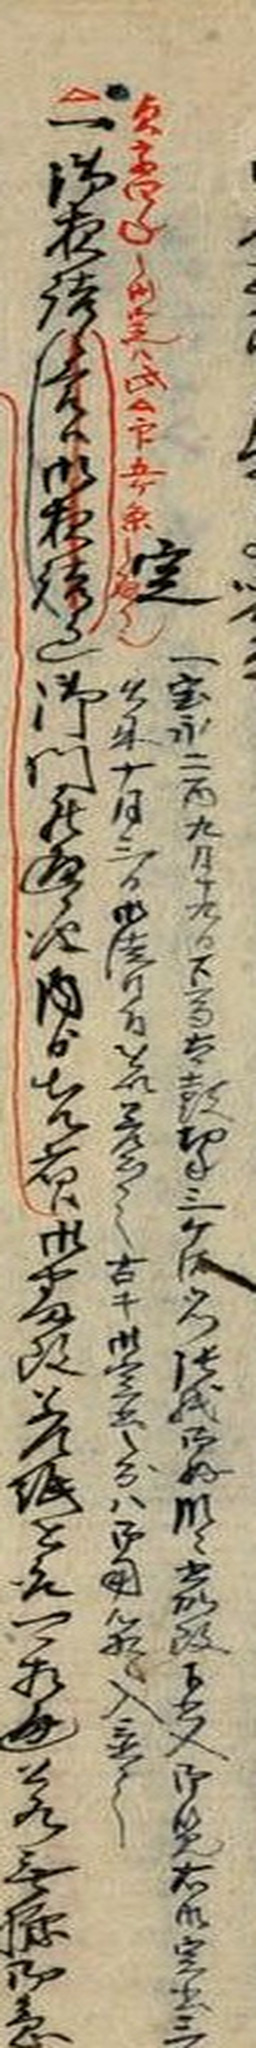△一御夜詰之節ハ御夜詰過御門罷通候儀内ゟ出ル者ハ御番改差紙を取可相通若無拠御急
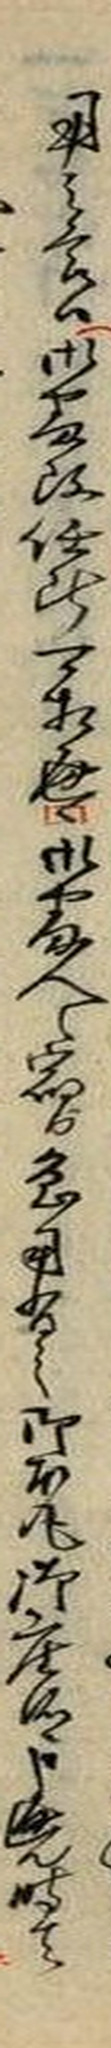用之節ハ御番改任断可相通候御番人之宿ゟ急用有之御本丸御座所へ申通ル時は
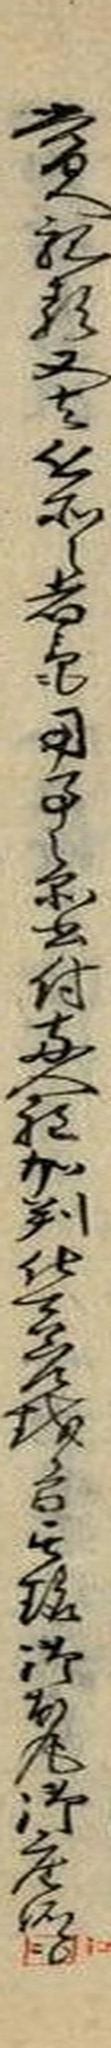当人親類又は近所之者ニ而も用事之品書付両人程加判仕可差越候間其趣御本丸御座所江も
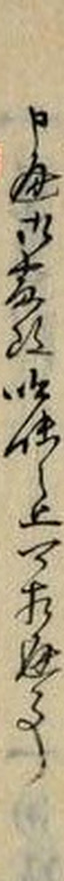申通御番改吟味之上可相通事
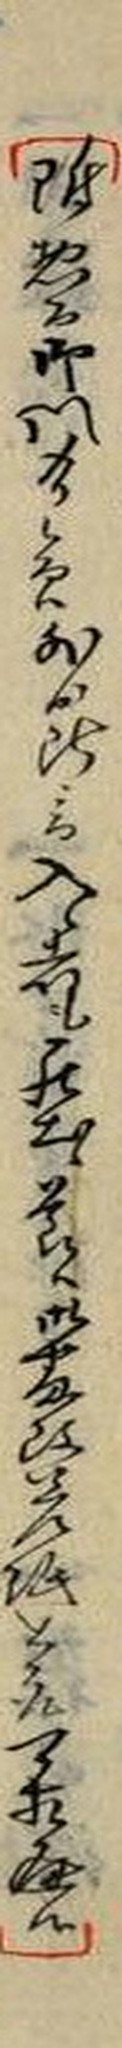附惣而御門〆り候而ハ外ゟ断ニ而入候者も罷出候節ハ御番改差紙を取可相通候
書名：御門御櫓之部
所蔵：福井県文書館 Fukui Prefectural Archives
